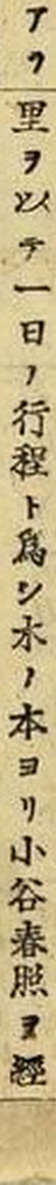里ヲ以テ一日ノ行程ト爲シ木ノ本ヨリ小谷春照ヲ經
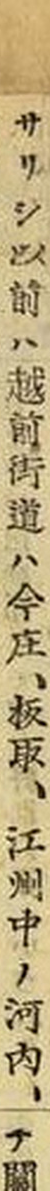サリシ以前ハ越前街道ハ今庄、坂取、江州中ノ河内、
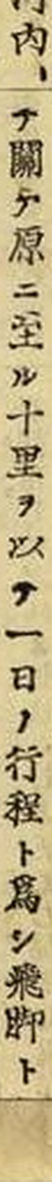テ關ケ原ニ至ル十里ヲ以テ一日ノ行程ト爲シ飛脚ト
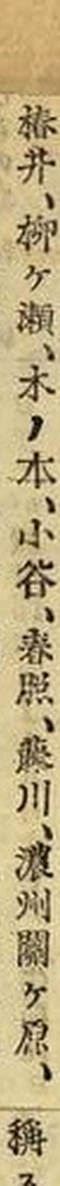椿井、柳ケ瀬、木ノ本、小谷、春照、藤川、濃州關ケ原
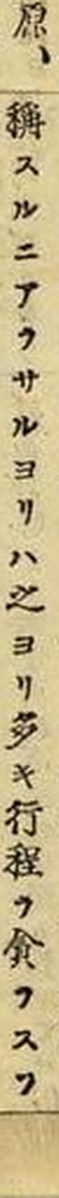稱スルニアラサルヨリハ之ヨリ多キ行程ヲ貪ラスソ
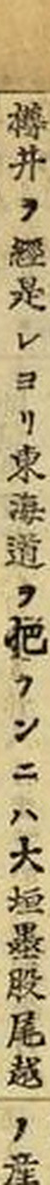椿井ヲ經是レヨリ東海道ヲ把ランニハ大垣墨俣尾越
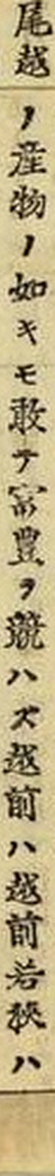ノ産物ノ如キモ敢テ富豊ヲ競ハズ越前ハ越前若狭ハ
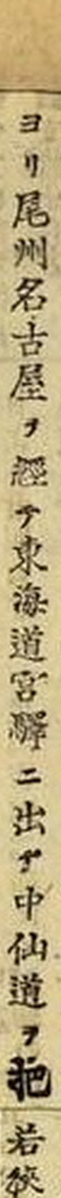ヨリ尾州名古屋ヲ經テ東海道宮驛ニ出テ中山道ヲ把
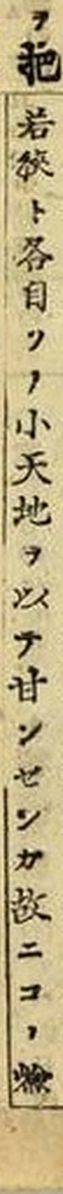若狭ト各自ソノ小天地ヲ以テ甘ンゼシガ故ニコノ險
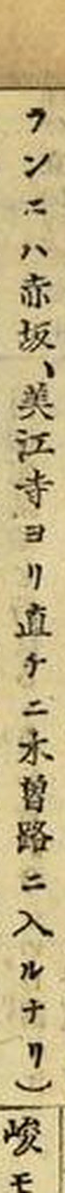ランニハ赤坂、美江寺ヨリ直チニ木曽路ニ入ルナリ
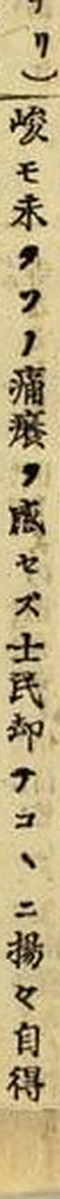峻モ未タソノ痛療ヲ感セズ士民却テコヽニ揚々自得
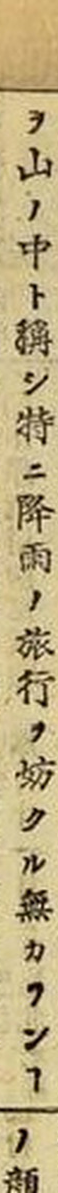ヲ山ノ中ト稱シ特ニ降雨ノ旅行ヲ妨クル無カランヿ
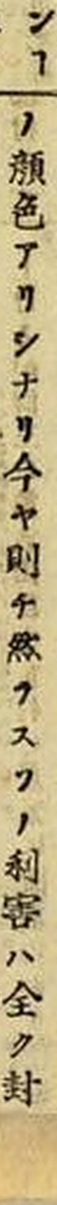ノ顔色アリシナリ今ヤ則チ然ラスソノ利害ハ全ク封
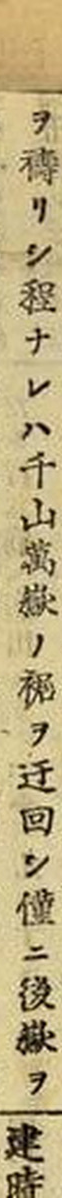ヲ禱リシ程ナレハ千山萬嶽ノ裾ヲ迂回シ僅ニ後嶽ヲ
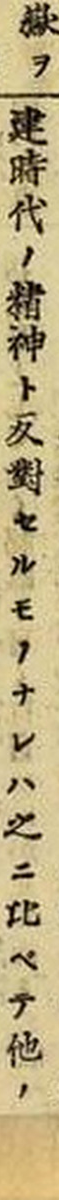建時代ノ精神ト反對セルモノナレハ之ニ比ベテ他ノ
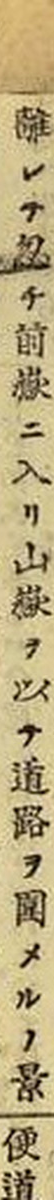離レテ忽チ前嶽ニ入リ山嶽ヲ以テ道路ヲ圍メルノ景
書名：温古集 五巻
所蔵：福井県文書館 Fukui Prefectural Archives
